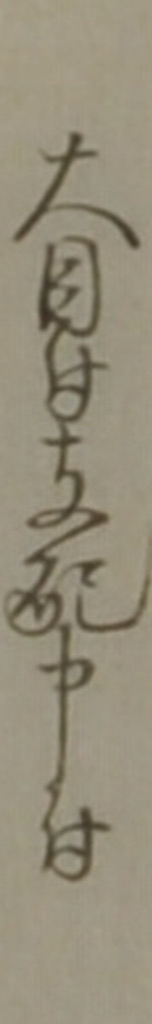大目付支配申付
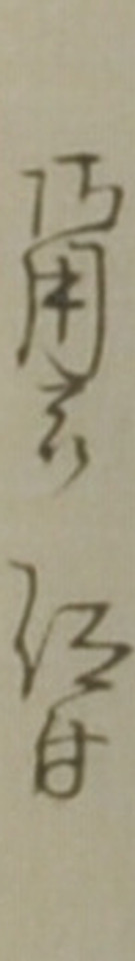御用被仰付

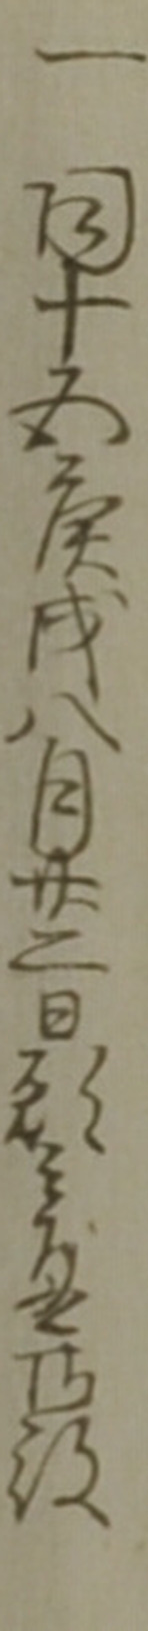一同十五庚戌八月廿二日願之通御役

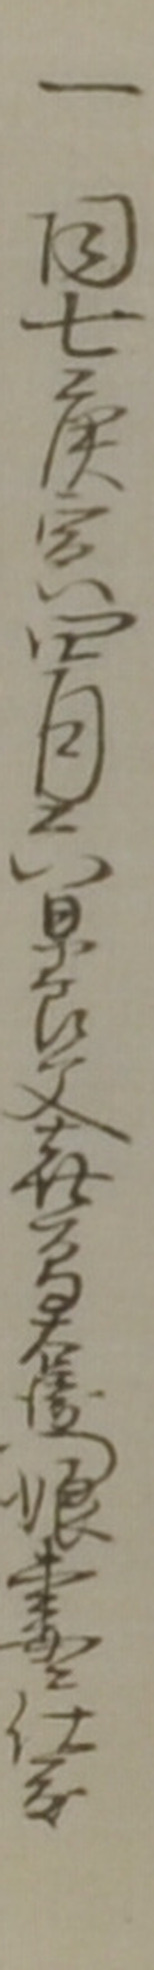一同七庚寅四月六日養父喜曽右衛門娘妻仕度
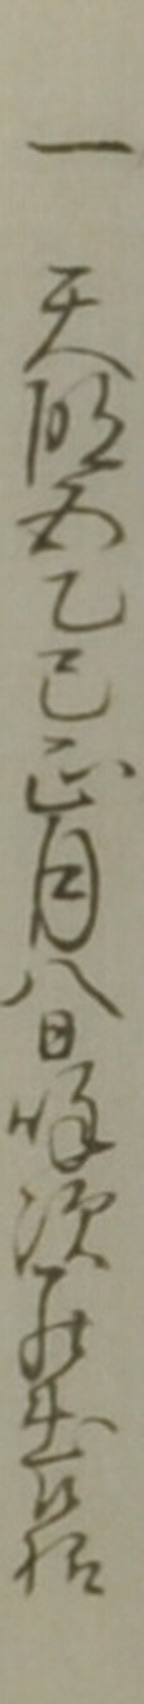一天明五乙巳正月八日呼次罷出候様

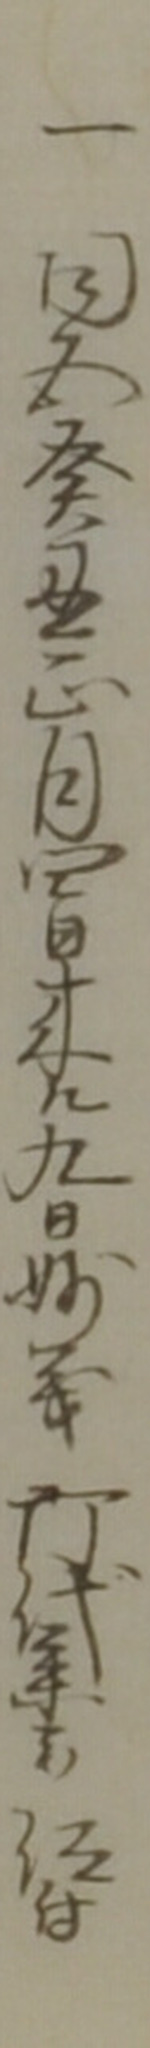一同五癸丑正月四日来九日妙義御代参被仰付
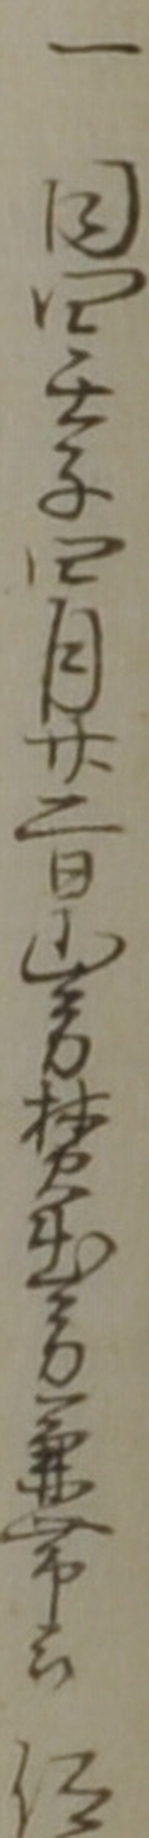一同四壬子四月廿ニ日山方焚出方兼帯被仰付
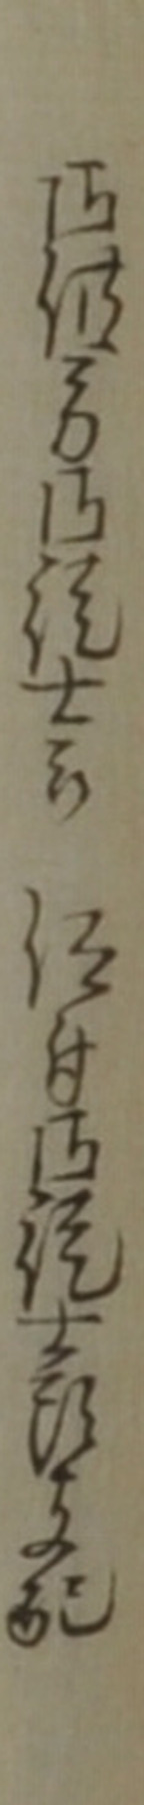御供方御徒士被仰付御徒士頭支配
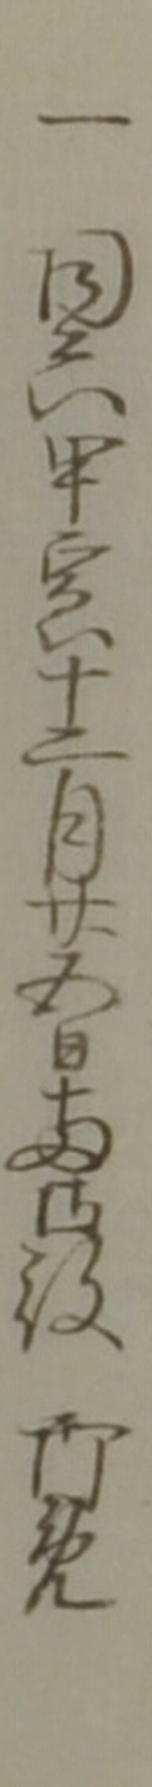一同六甲寅十二月廿五日両御役御免

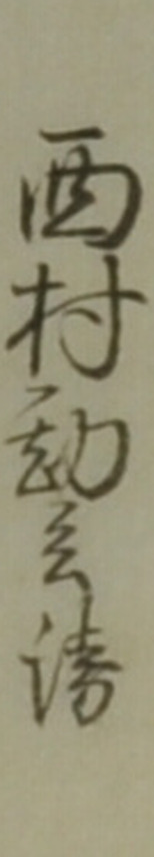西村勘兵衛
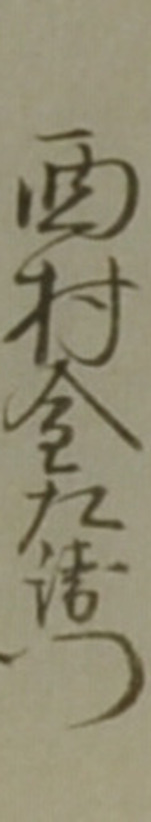西村金左衛門
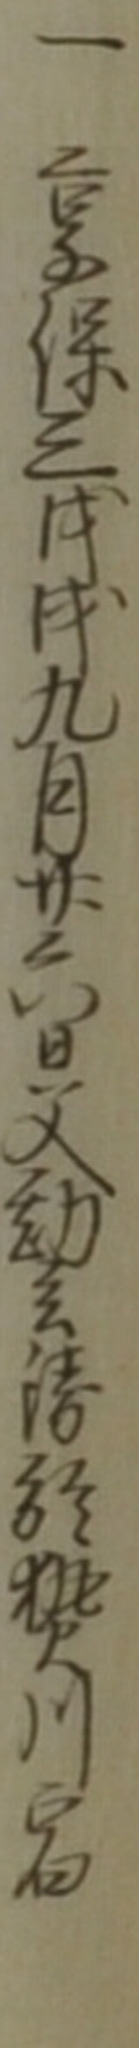一享保三戊戌九月廿六日父勘兵衛於贄川宿
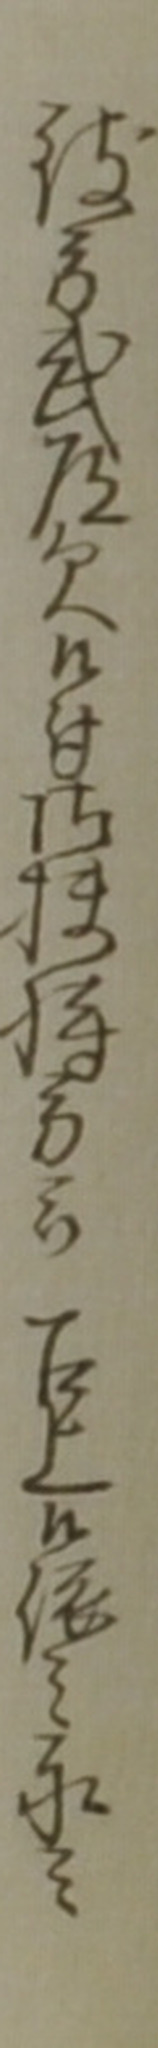致方武道欠候付御扶持方被召上候依之永之
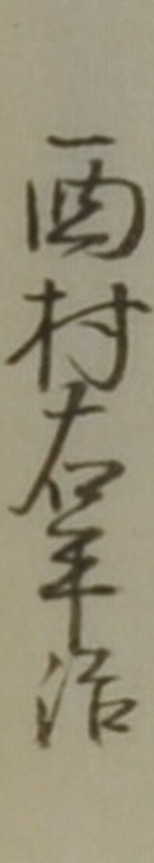西村右平治
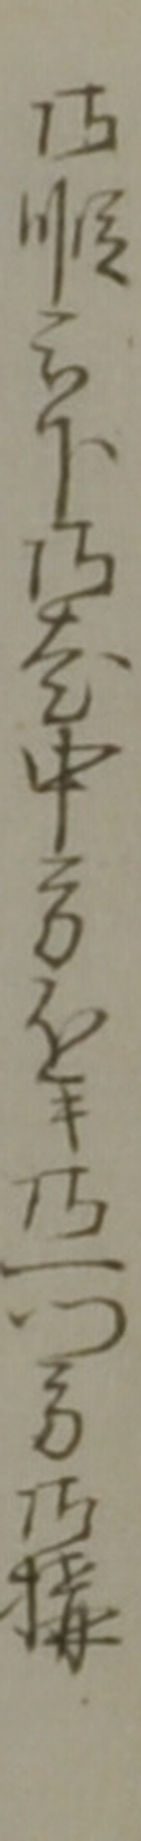御暇被下御老中方近御一門方御構
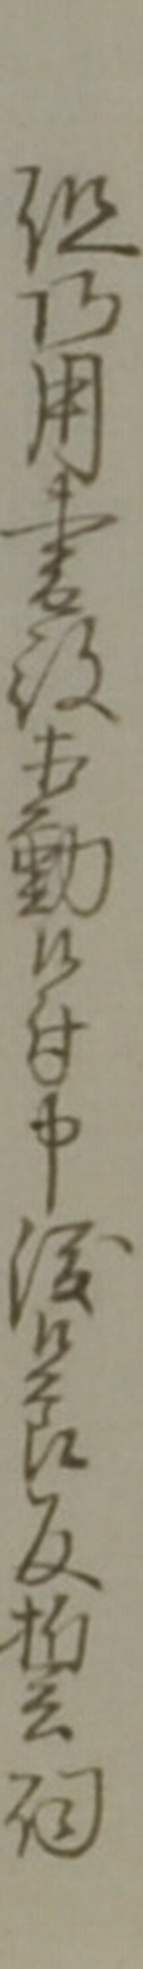但御用書役相勤候付申渡候節反誓伺
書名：無足廃家（弐）
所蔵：伊那市立高遠町図書館・合同会社AMANE
